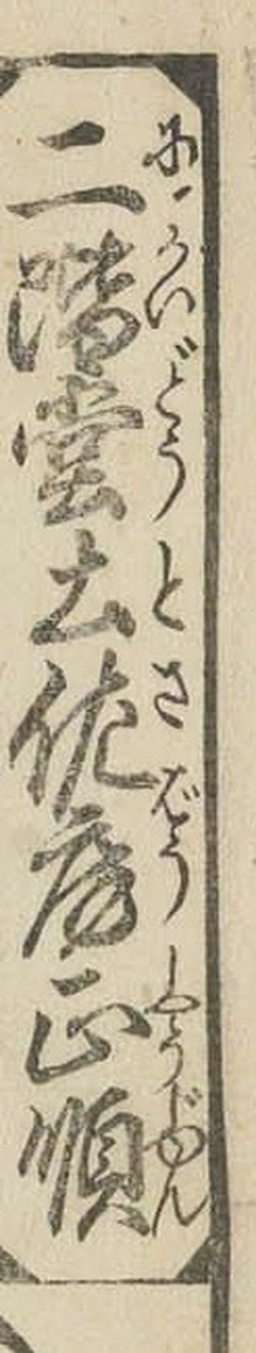二階堂土佐房正順
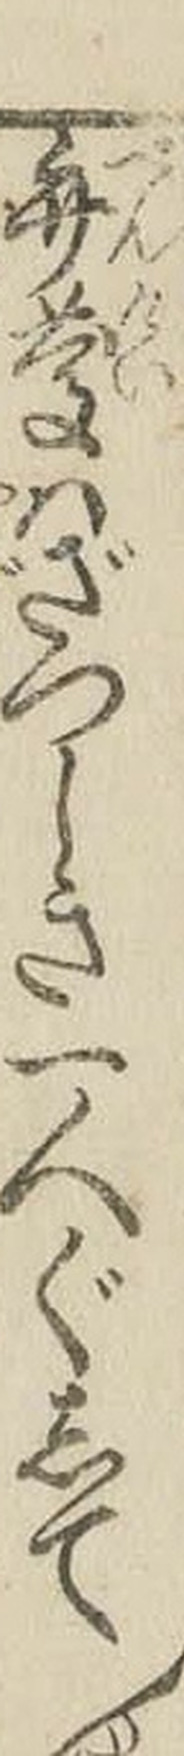弁慶はざつしき一人ぐして
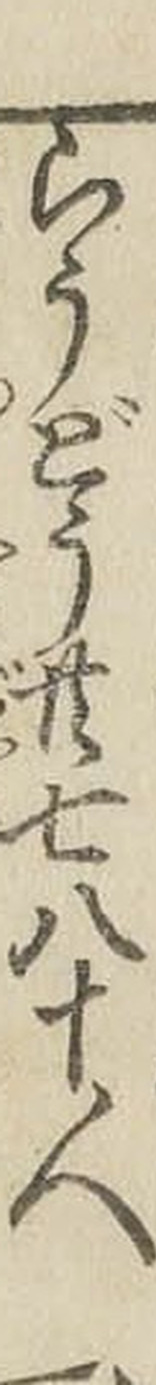らうどう共七八十人
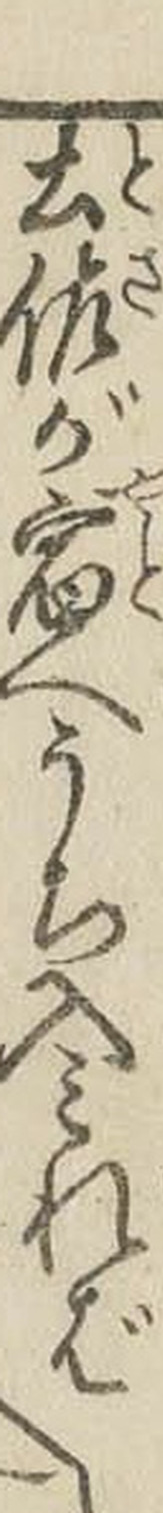土佐が宿へうち入みれば
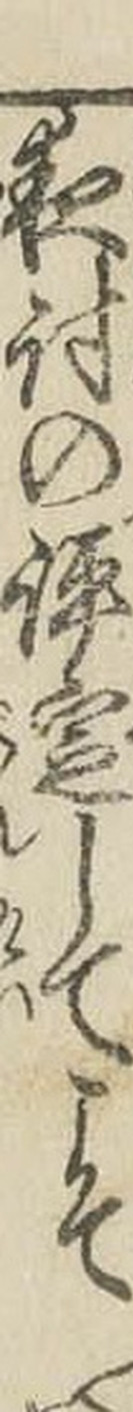夜討の評定してこそ
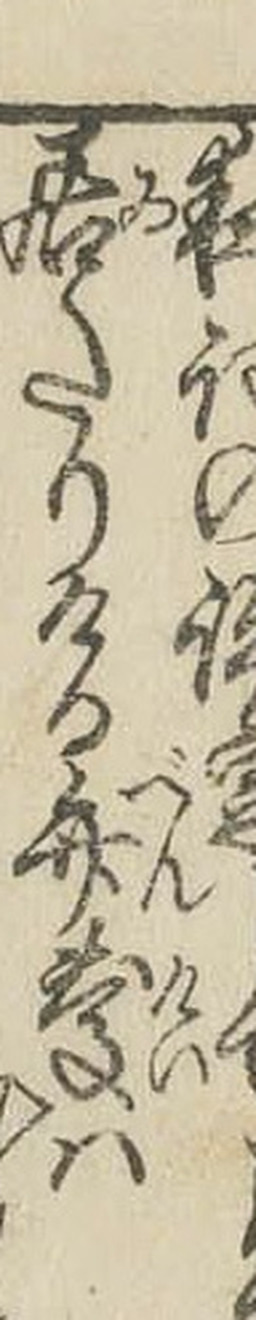居たりける弁慶は
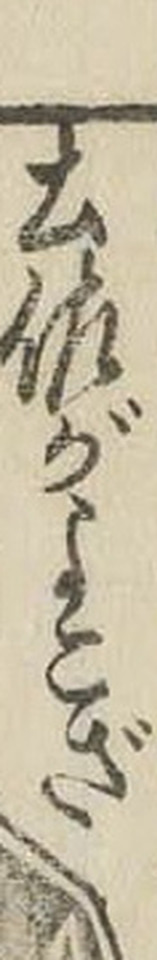土佐がよこざ
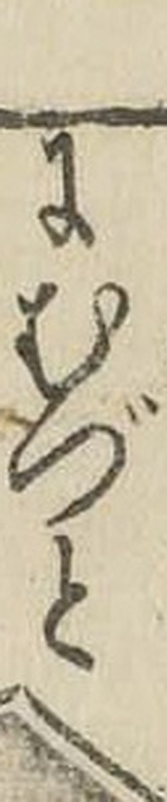にむづと
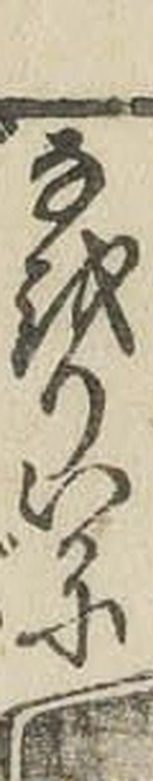なをりいかに
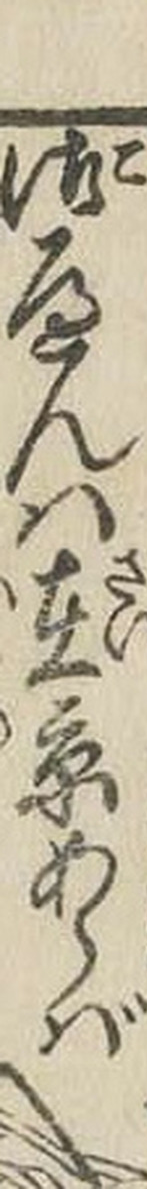御へんは在京あらば
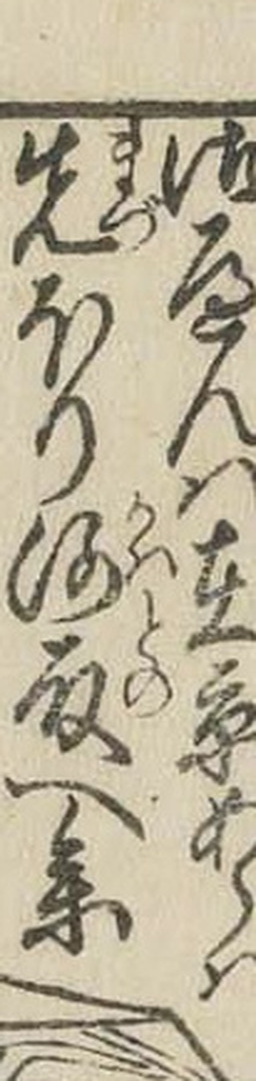先ほり河殿へ参
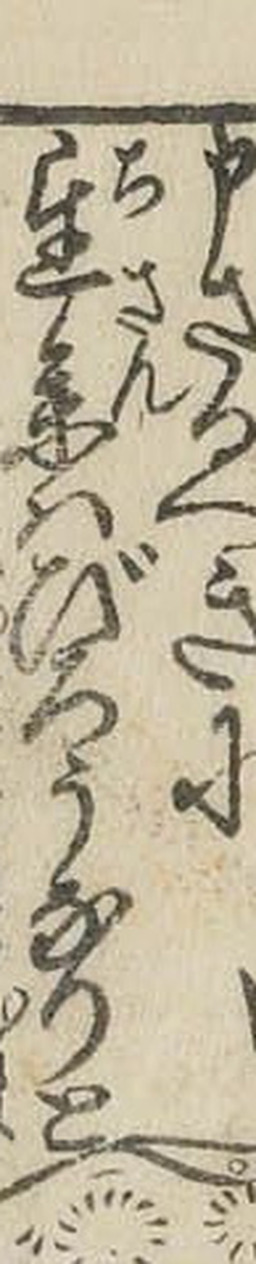遅参はびろうなりと
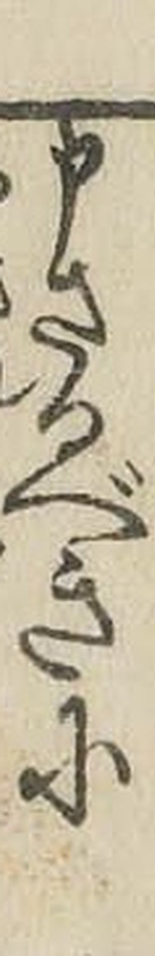申さるべきに
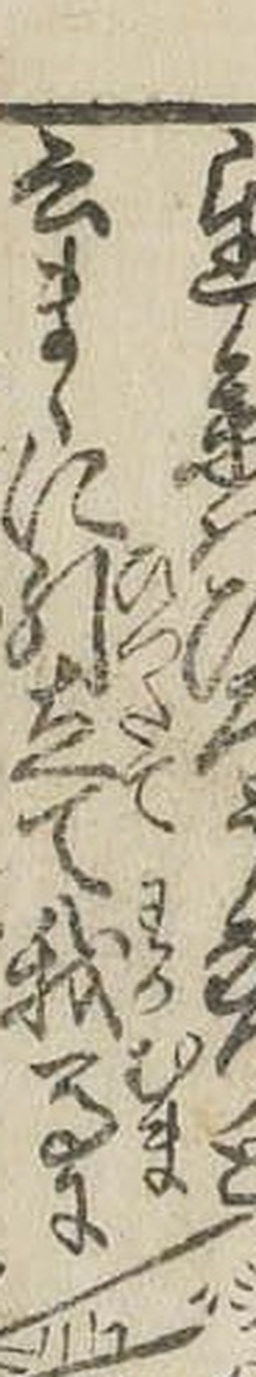云まゝに引立て我馬に
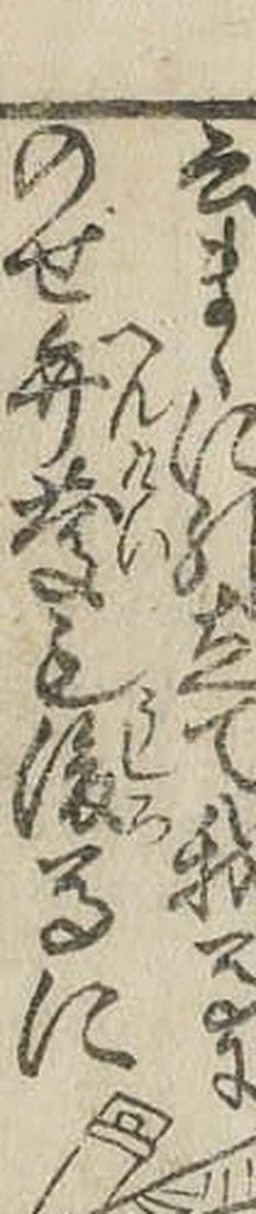のせ弁慶も後馬に
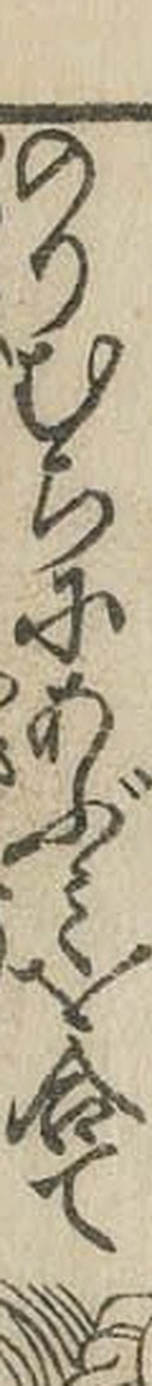のりむちにあぶみを合て
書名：絵本写宝袋 9巻 3之巻
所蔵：東京学芸大学教育コンテンツアーカイブ
